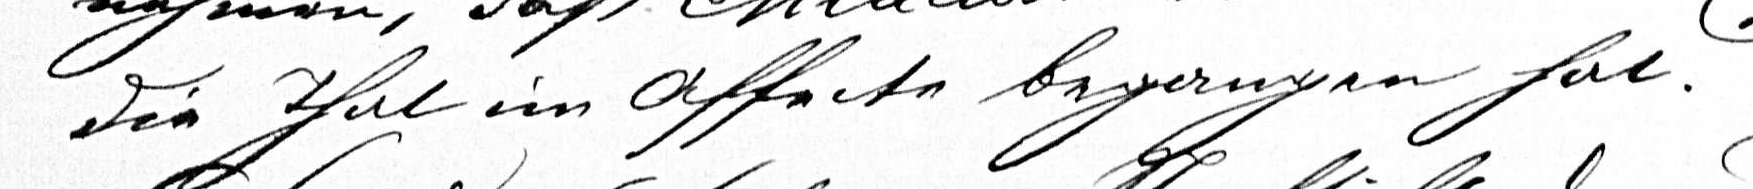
die That im Affecte begangen hat.
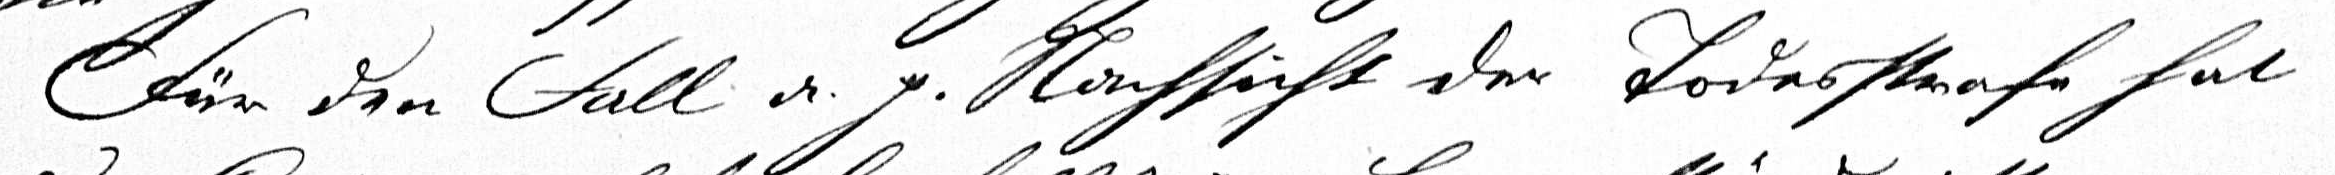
Für den Fall a.g. Nachsicht der Todesstrafe hat
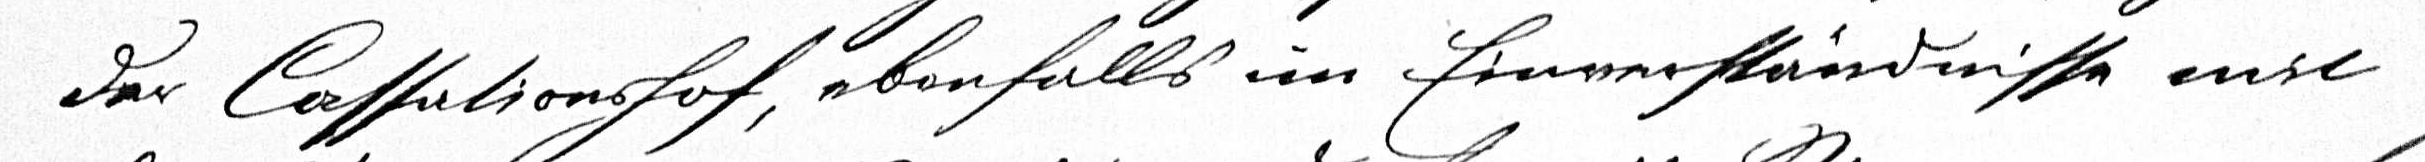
der Cassationshof, ebenfalls im Einverständnisse mit
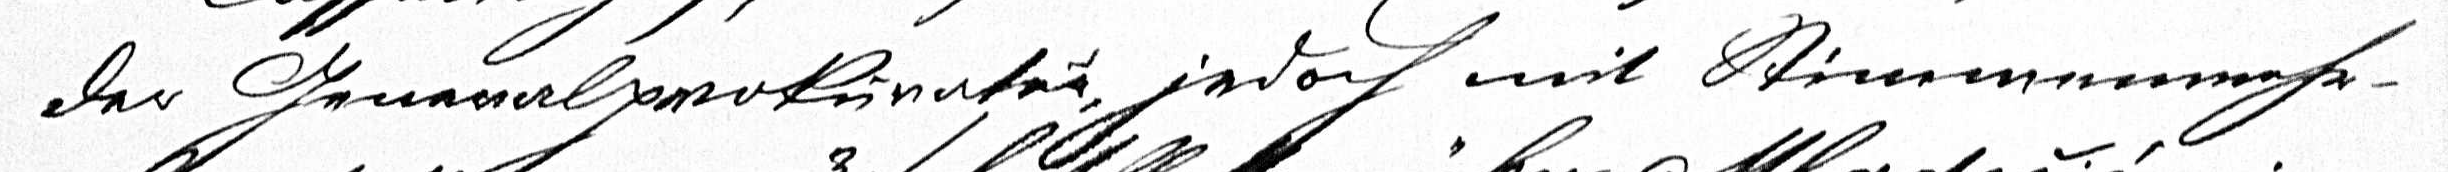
der Generalprokuratur, jedoch mit Stimmenmehr¬
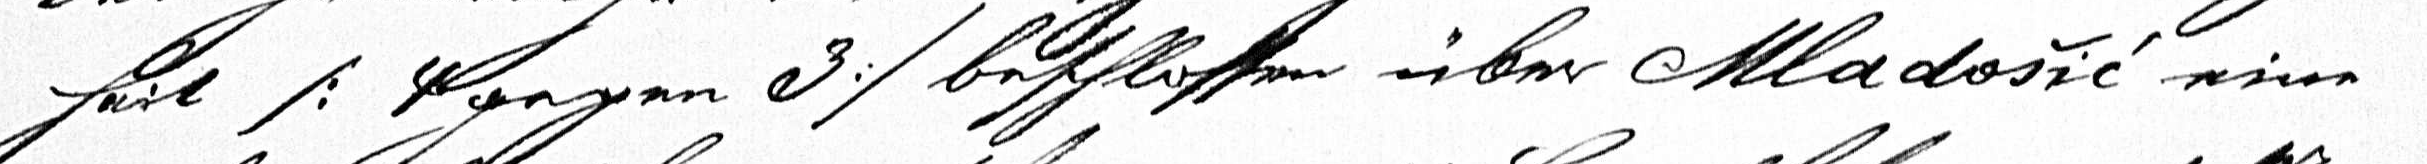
heit (4 gegen 3) beschlossen über Mladošić eine
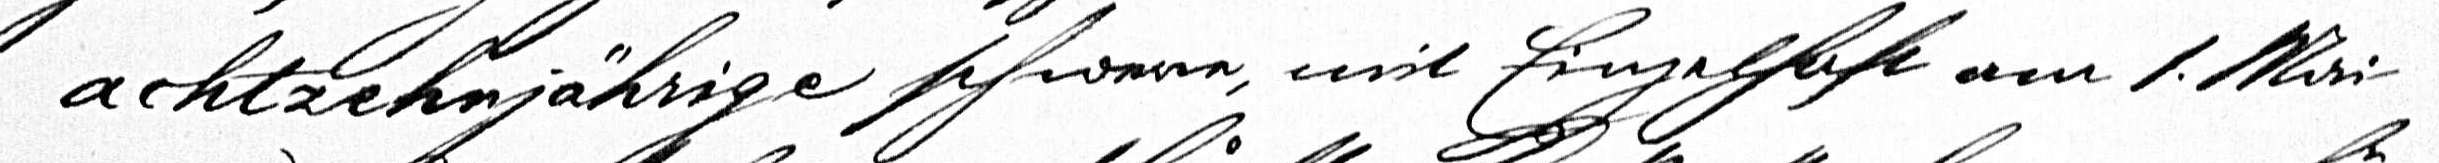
achtzehnjährige schwere, mit Einzelhaft am 1. Mai
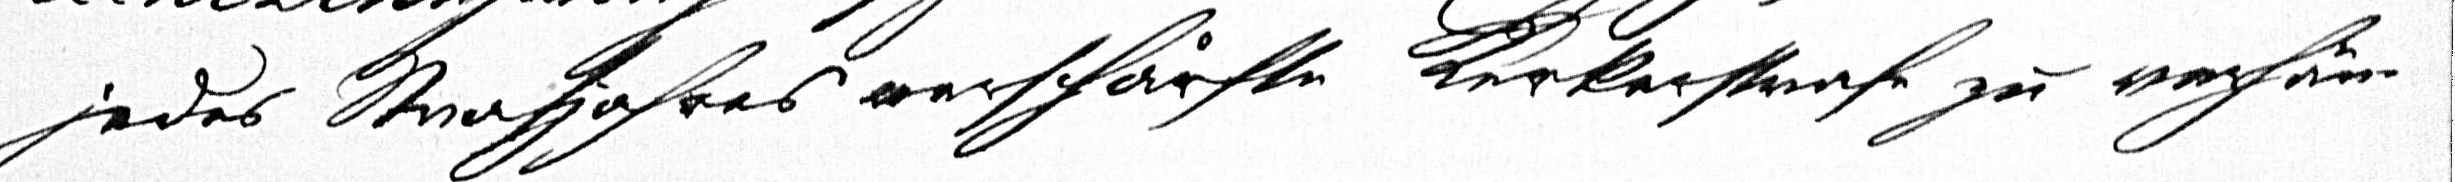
jedes Strafjahres verschärfte Kerkerstrafe zu verhän¬
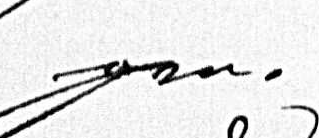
gen.
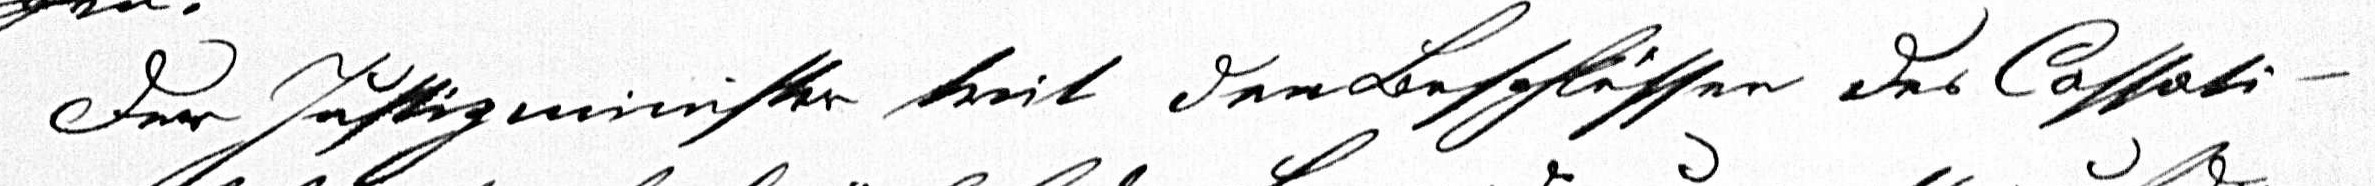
Der Justizminister trit dem Beschlüssen des Cassati¬
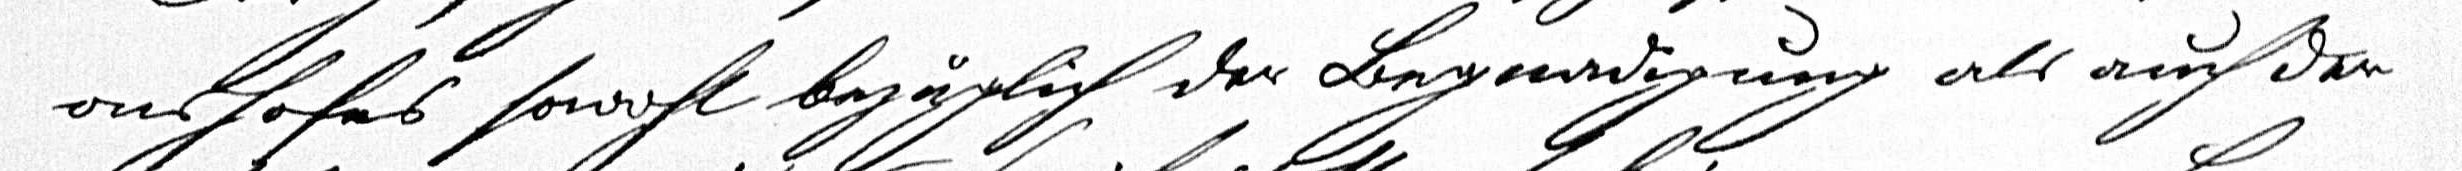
onshofes sowohl bezüglich der Begnadigung als auch der
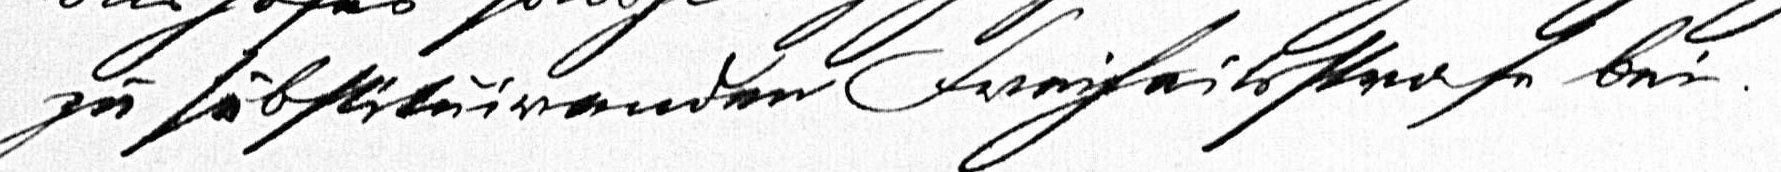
zu substituirenden Freiheitsstrafe bei.
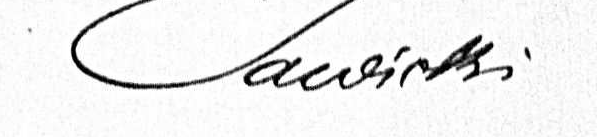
Sawicki
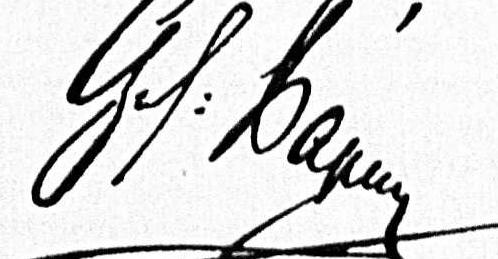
Ges. Papay
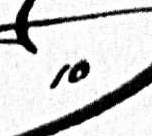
10
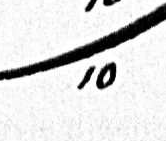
10
